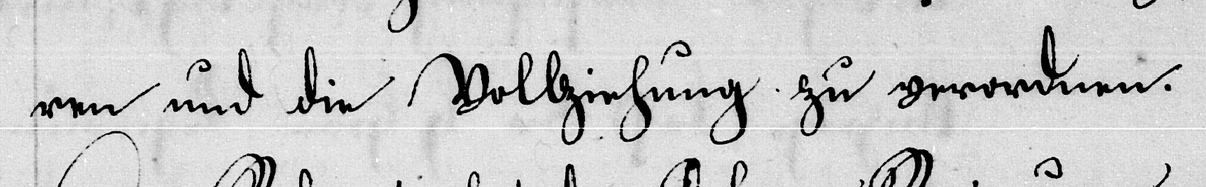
ren und die Vollziehung zu verordnen.
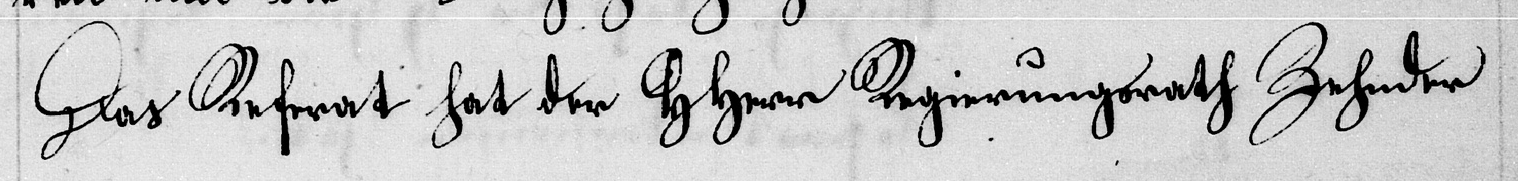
Das Referat hat der HHerr Regierungsrath Zehnder
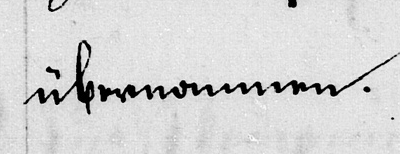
übernommen.
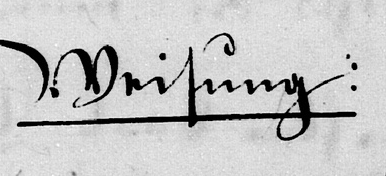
Weisung:
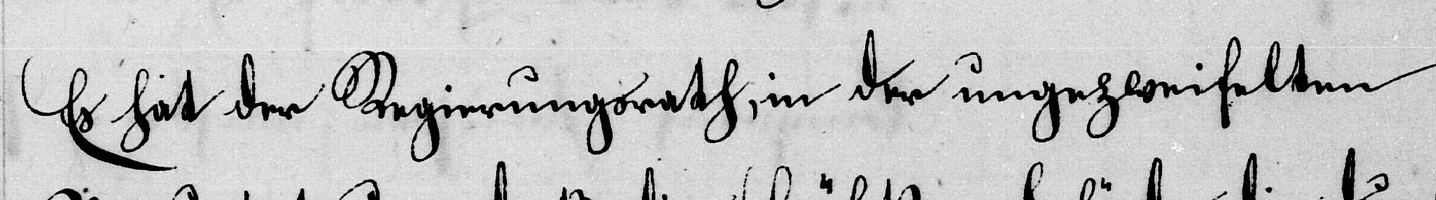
Es hat der Regierungsrath, in der ungezweifelten
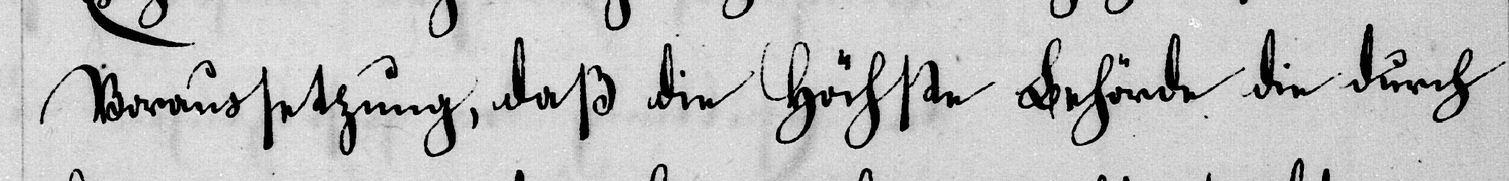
Voraussetzung, daß die Höchste Behörde die durch
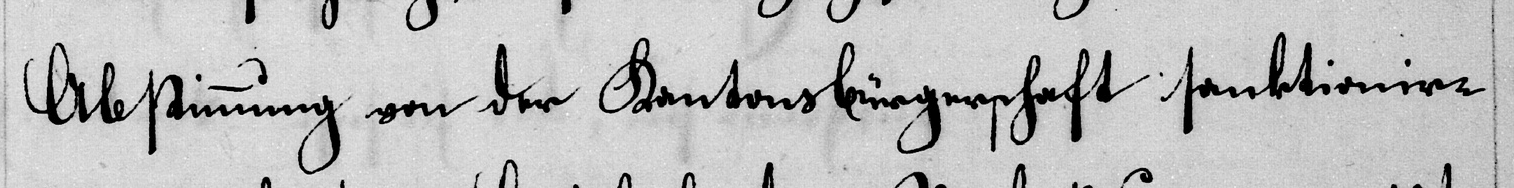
Abstimmung von der Kantonsbürgerschaft sanktionir¬
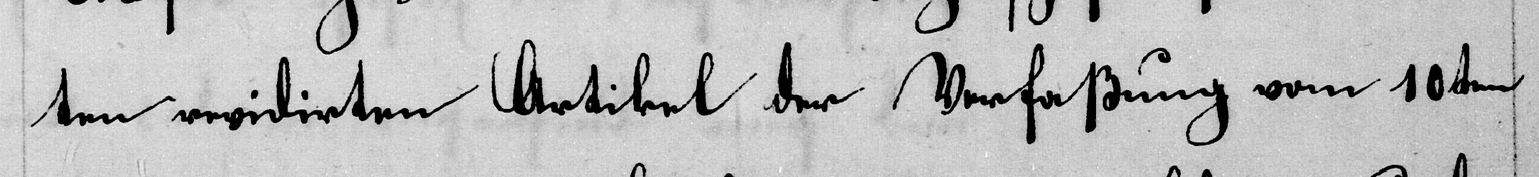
ten revidirten Artikel der Verfaßung vom 10ten
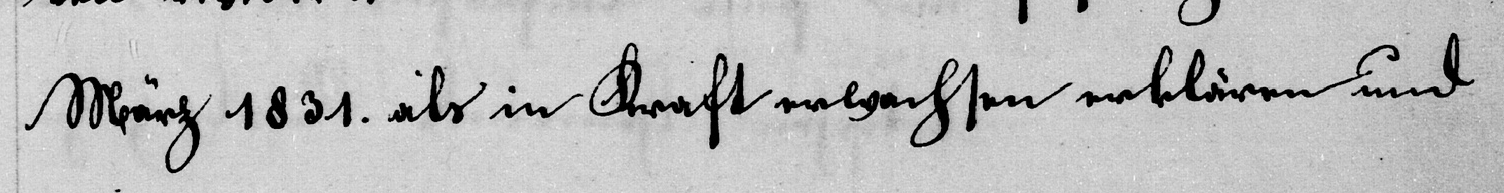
März 1831. als in Kraft erwachsen erklären und
